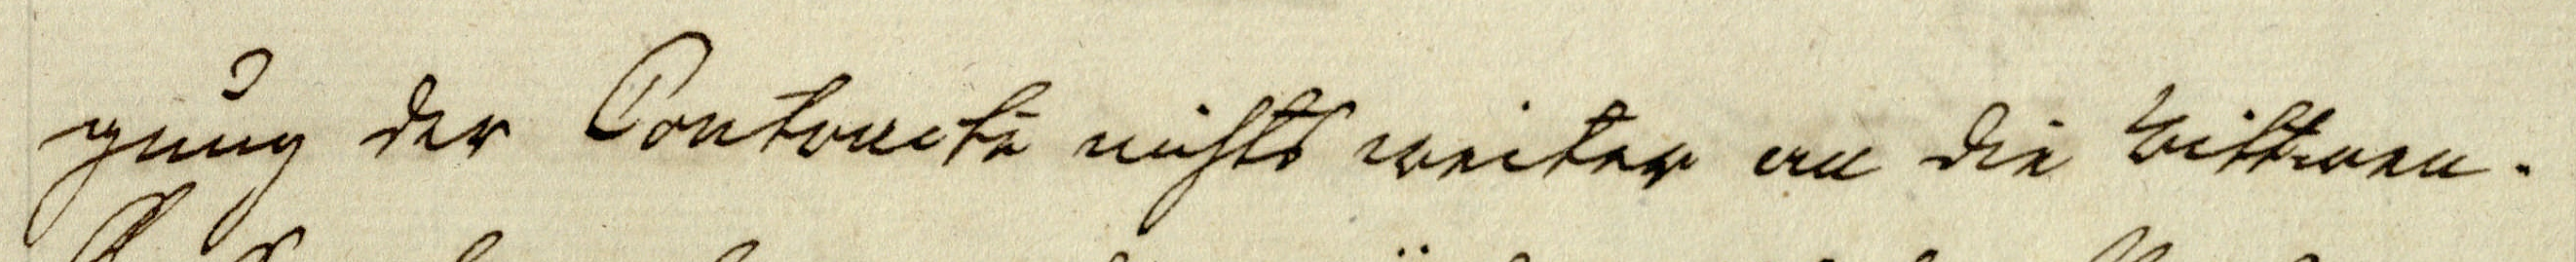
gung der Contracte nichts weiter an die Wittwen¬
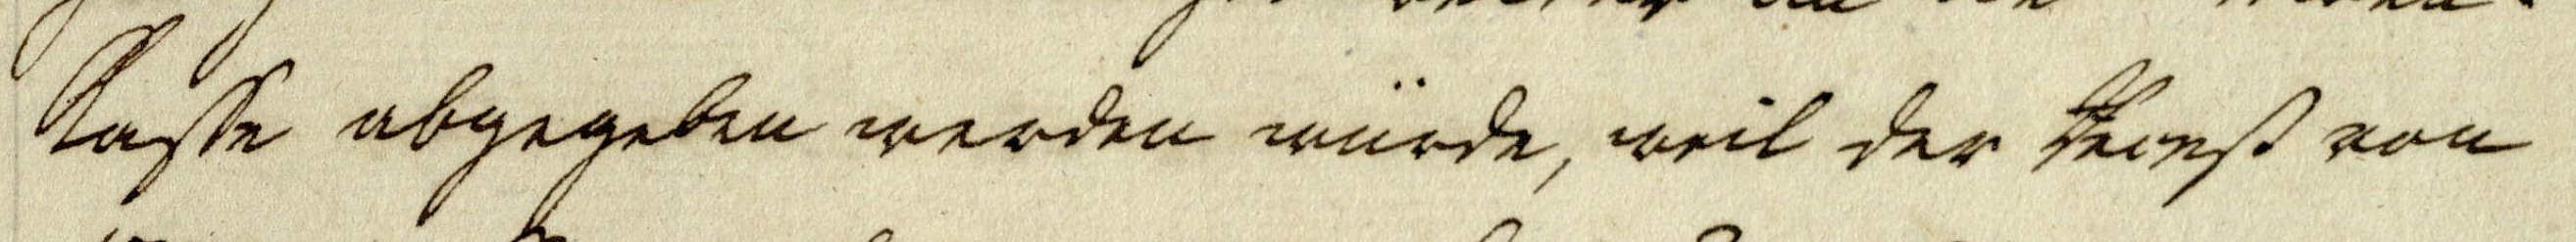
Kasse abgegeben werden würde, weil der Receß von
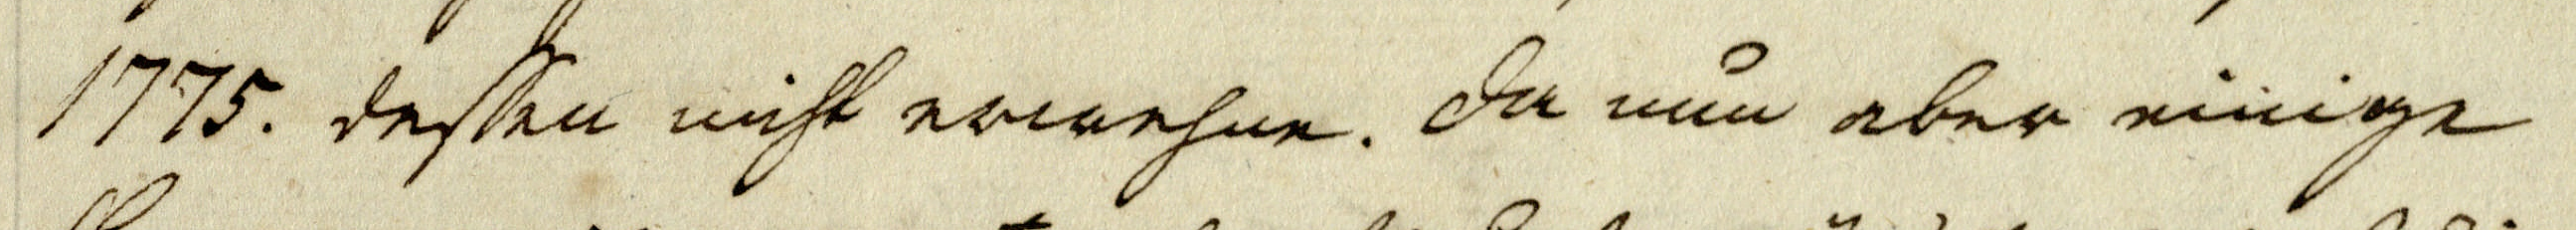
1775. dessen nicht erwehne. Da nun aber einige
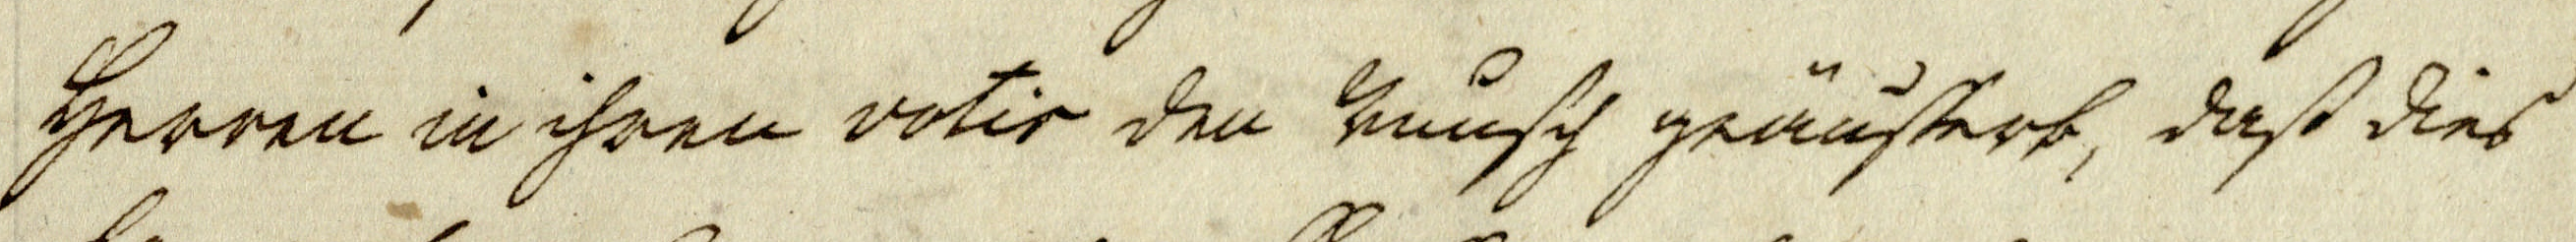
Herren in ihren votis den Wunsch geäussert, daß dies
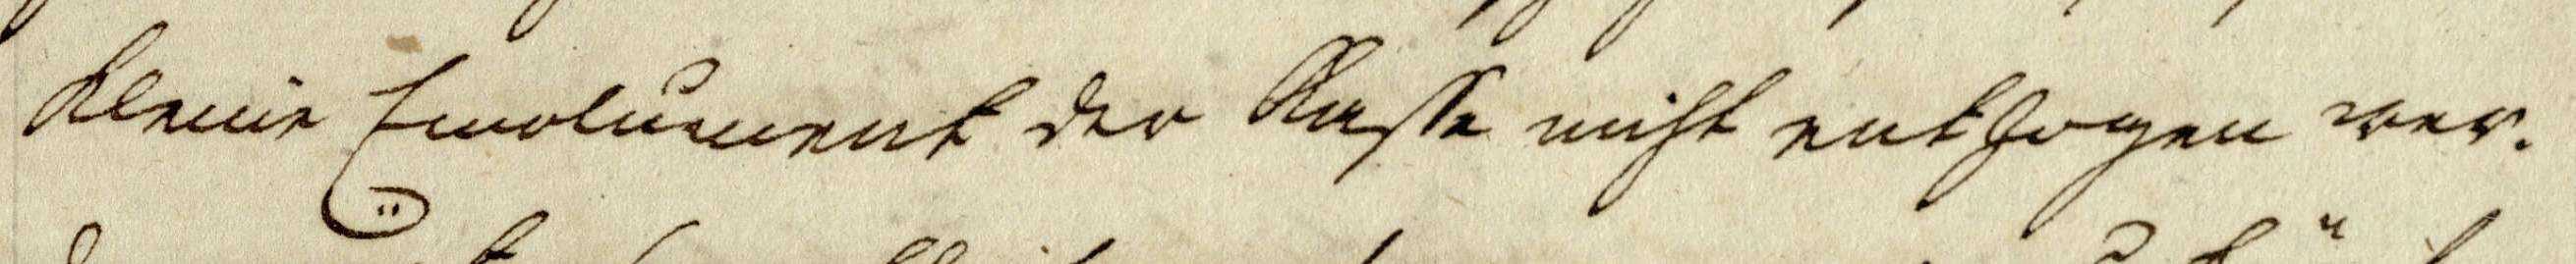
kleine Emolument der Kasse nicht entzogen wer¬
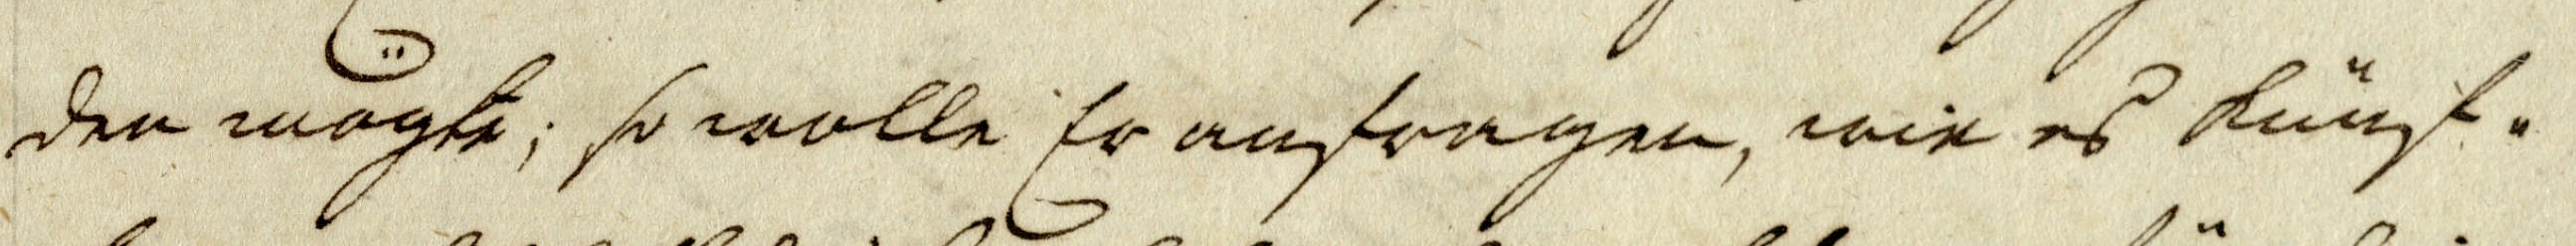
den mögte; so wolle Er anfragen, wie es künf¬
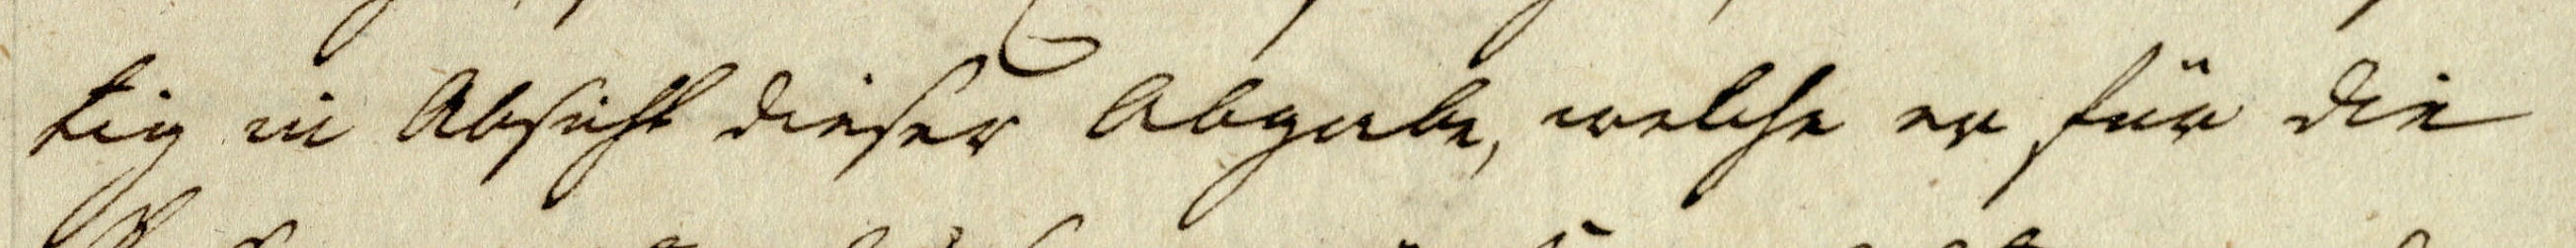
tig in Absicht dieser Abgabe, welche er für die
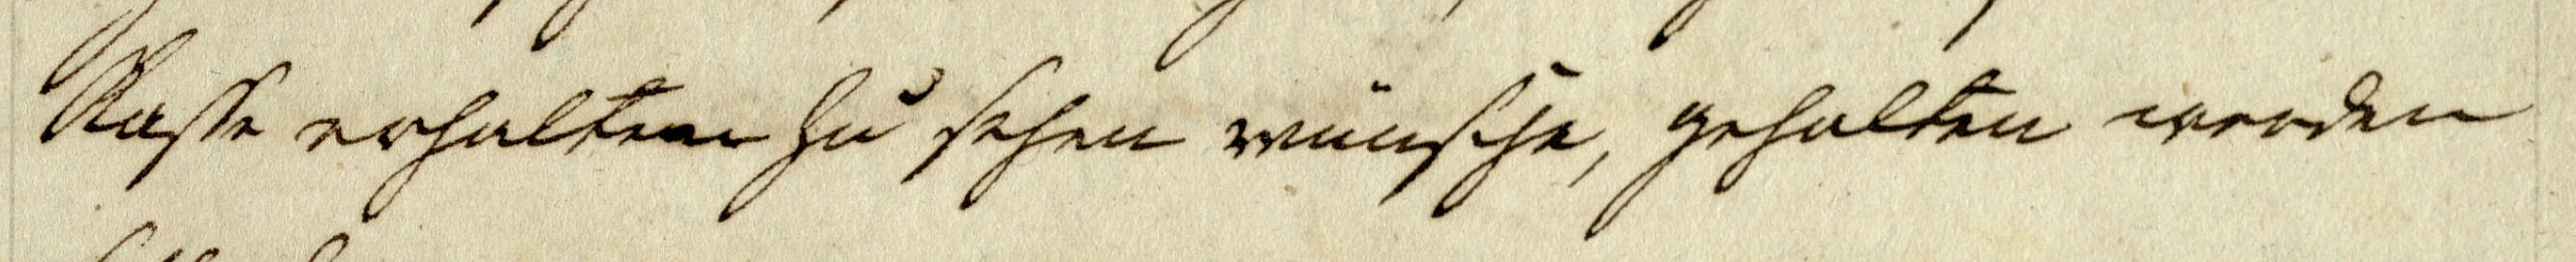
Kasse erhalten zu sehen wünsche, gehalten werden
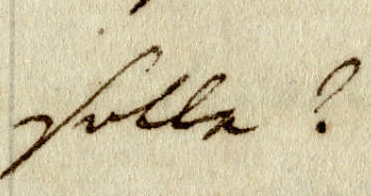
solle?
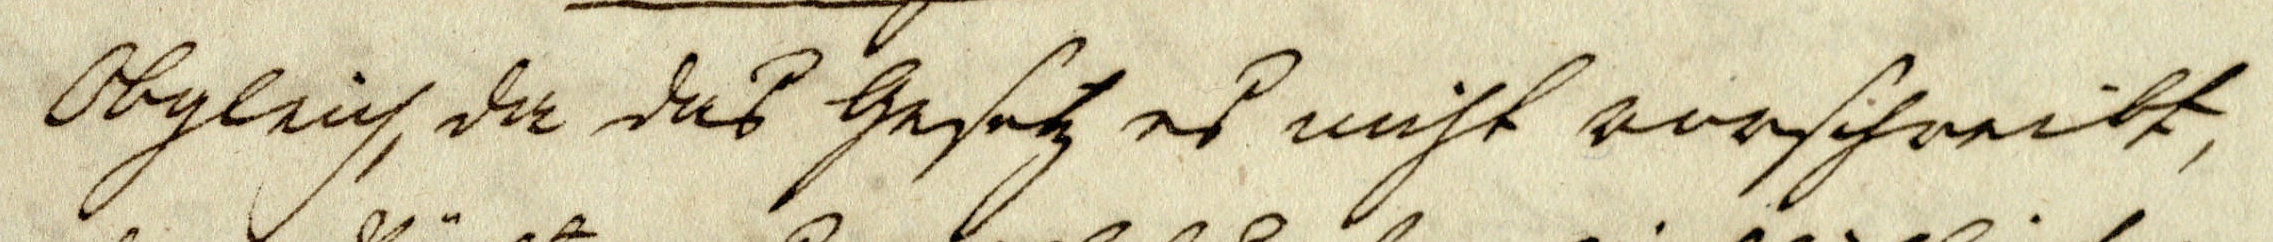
Obgleich, da das Gesetz es nicht vorschreibt,
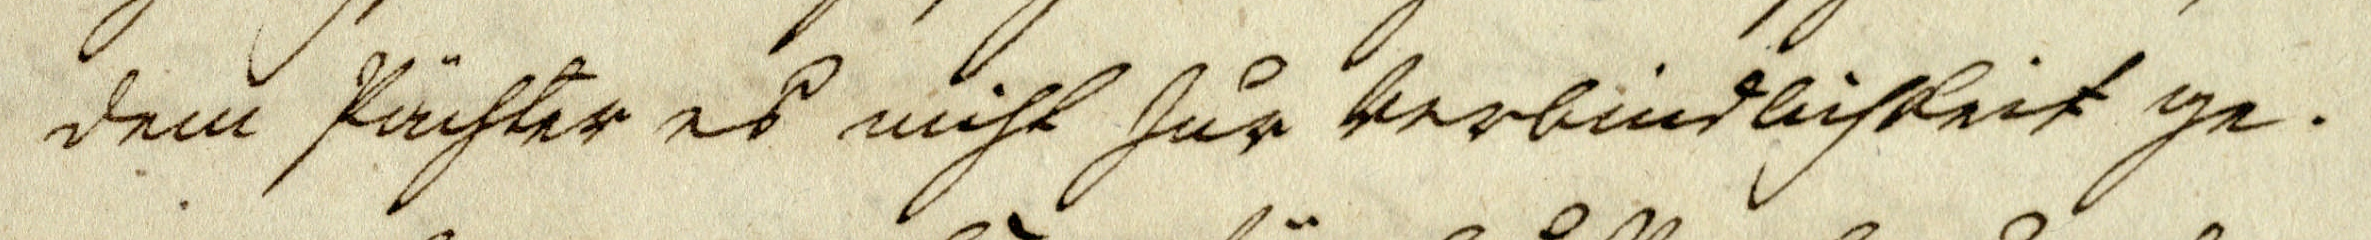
dem Pächter es nicht zur Verbindlichkeit ge¬
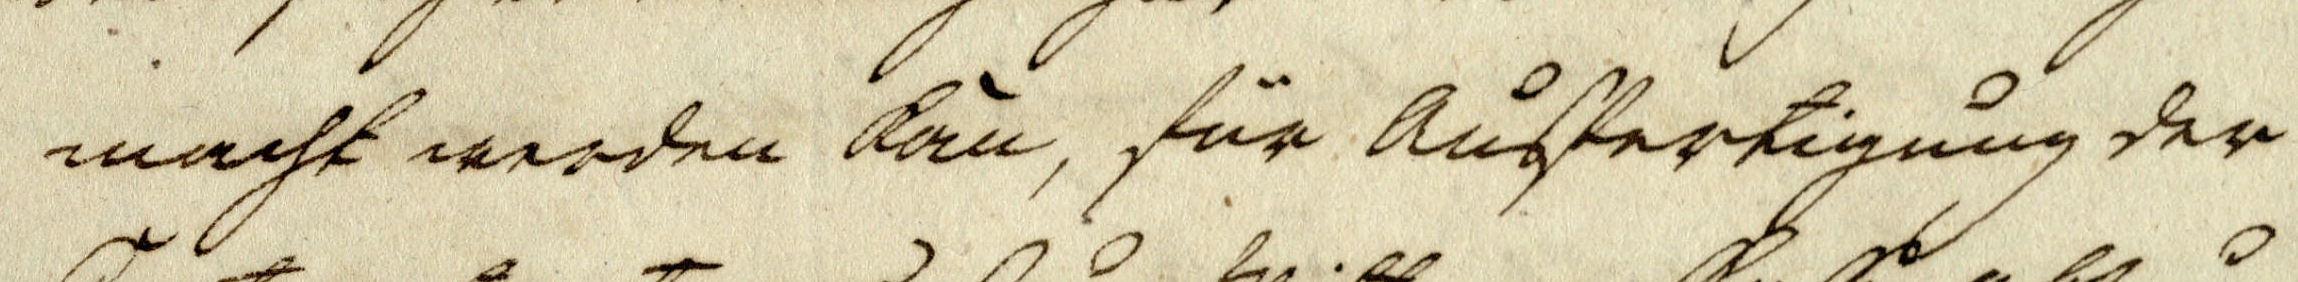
macht werden kan, für Ausfertigung der
